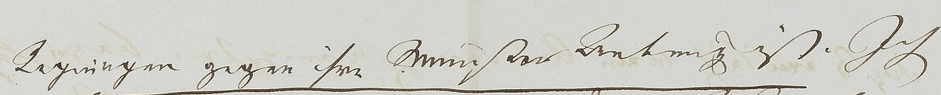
Regiergen gegen ihre Minister Uebung ist. Ich
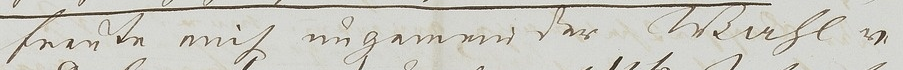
freute mich ungemein der Wahl von
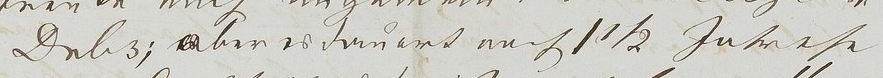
Dubs ; aber es dauert noch 1½ Jahr ehe
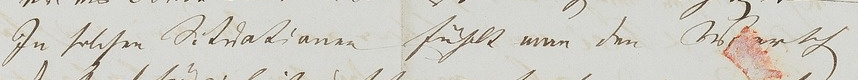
In solchen Situationen fühlt man den Wunsch d
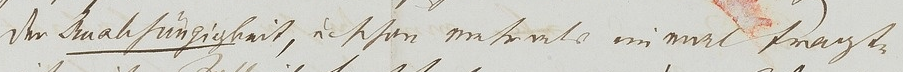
er Unabhängigkeit, u. schon mehr als einmal fragte
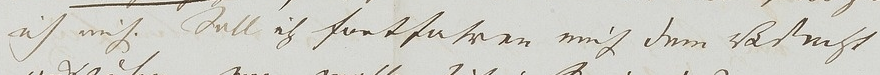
ich mich. Soll ich fortfahren mich dem Vdacht
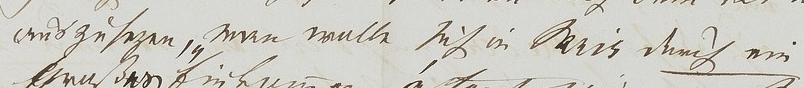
auszusezen, «man wolle sich in Parisdurch ein
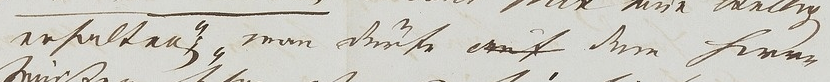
erhalten», «man dürfe auf dem Herrn
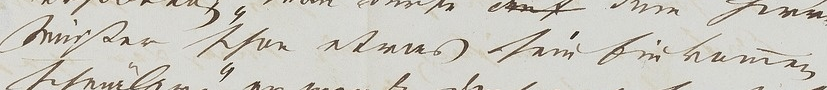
Minister schon etwas sein Einkommen
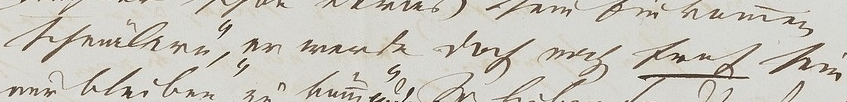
schmälern», «er werde doch noch froh sein
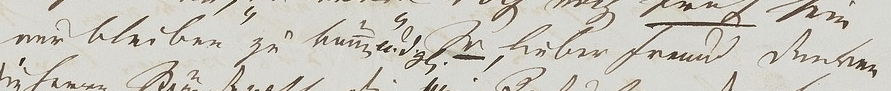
nur bleiben zu können» u. d.gl. –! So, lieber Freund denken
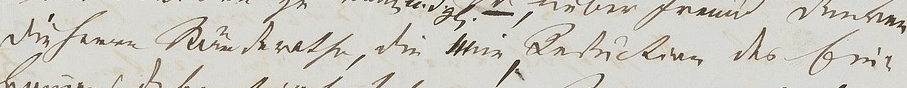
die Herrn Ständeräthe, die eine Reduction des Ein-
